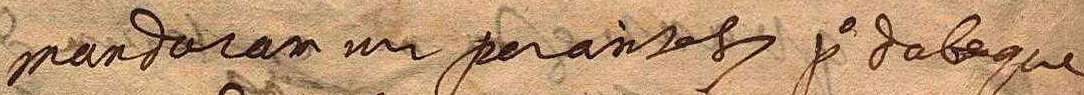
mandaram uir perante sj po da beque
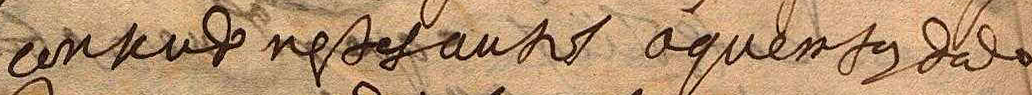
conteudo nestes autos a quem foj dado
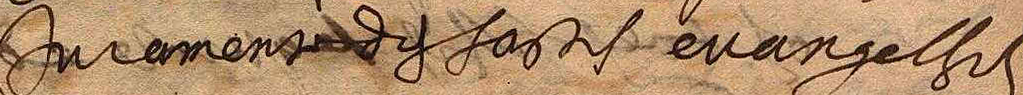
Juramento dos santos euangelhos
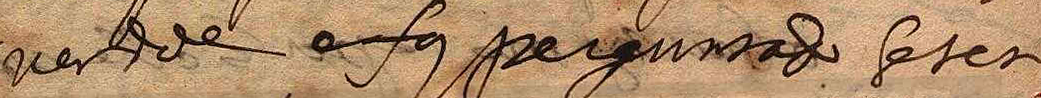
uerdade e foj perguntado se tem
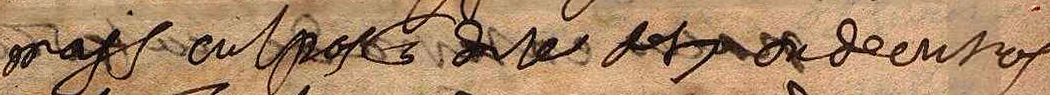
majs culpas q̄ dizer de sj ou outras
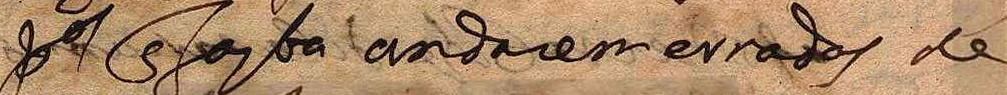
pas q̄ sajba andarem erradas de
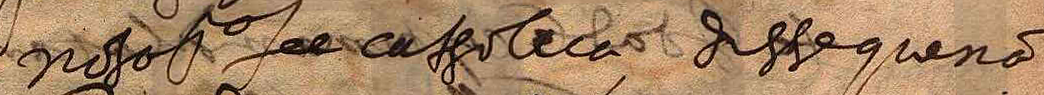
nosa sta fee catholica, disse que nā
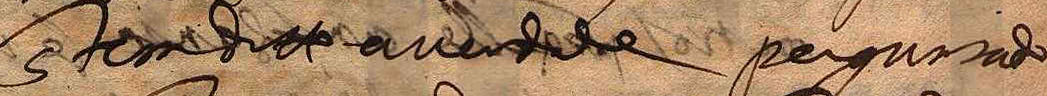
q̄ tem ditto a uerdade perguntado
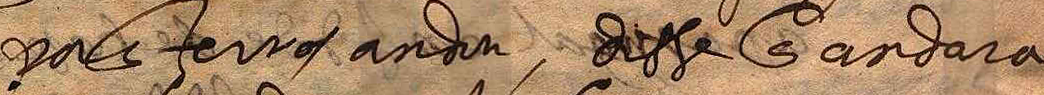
por q̄ terras andou, disse q̄ andara
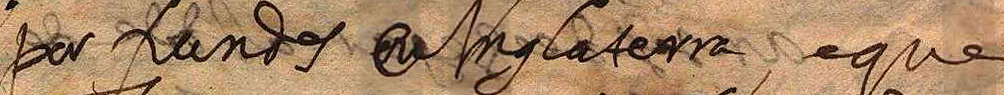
por frandes e Jnglaterra, e que
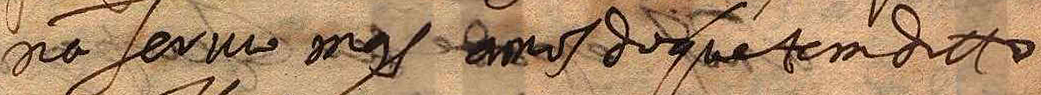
nā seruio majs annos do que tem ditto
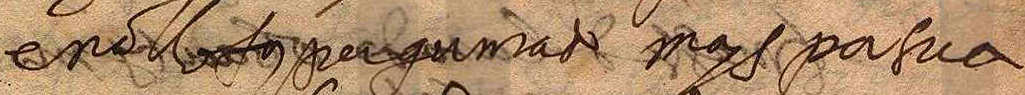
e nā lhe foj perguntado majs por sua
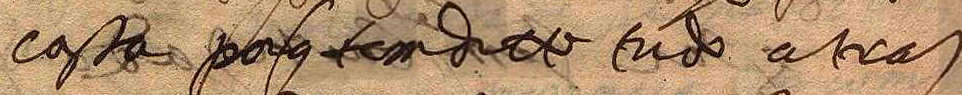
casta porq̄ tem ditto tudo atraz
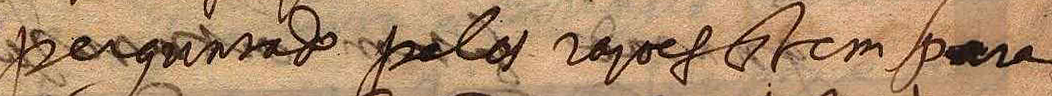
perguntado pelas razoes q̄ tem para
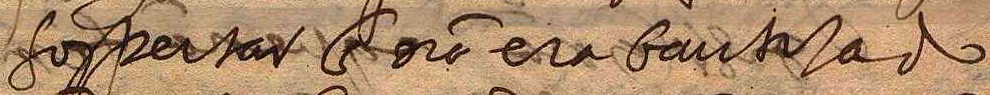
sospeitar q̄ nā era bautizado
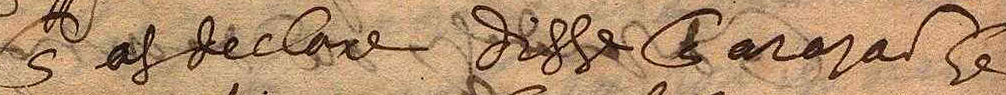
q̄ as declare disse q̄ a razaõ he
